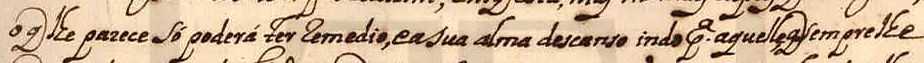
o q̄ lhe parece só poderá ter Remedio, e a sua alma descanso indo p.a aquelle q̄ sempre lhe
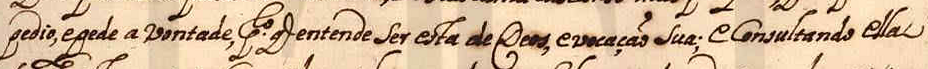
pedio, e pede a vontade, p̄.lo q̄ entende ser esta de Deos, e vocaçaõ sua, e Consultando ella
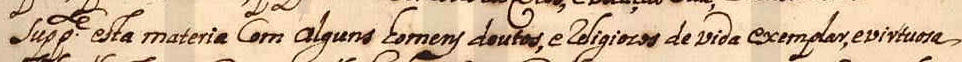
Supp.te esta materia Com alguns homens doutos, e Religiozos de vida exemplar, e virtuosa
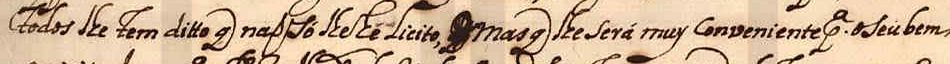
todos lhe tem ditto q̄ naõ só lhe he licito, q̄ mas q̄ lhe será muy conveniente p.a o seu bem
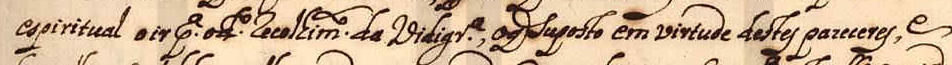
espiritual, o ir p.a o d.o Recolhim.to da Vidigr.a, o q̄ suposto em virtude destes pareceres, e
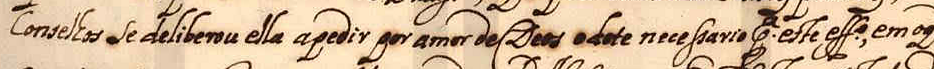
Conselhos se deliberou ella a pedir por amor de Deos o dote necessario p.a este eff.o, em o q̄
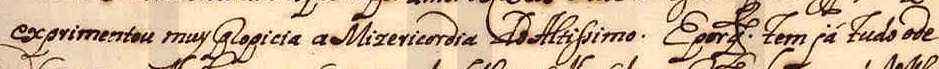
exprimentou muy propicia a Mizericordia do Altissimo. E porq.to tem já tudo o de
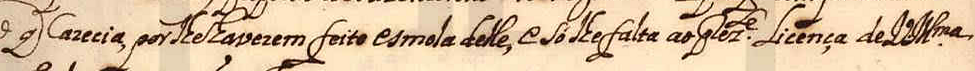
q̄ Carecia, por lhe haverem feito esmola delle, e só lhe falta ao prez.te Licença de V. Ill.ma
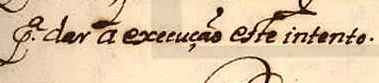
p.a dar a execuçaõ este intento.
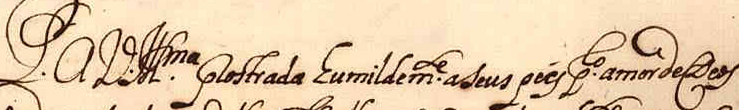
P. A V. Ill.ma prostrada humildem.te a seus peés p̄.lo amor de Deos
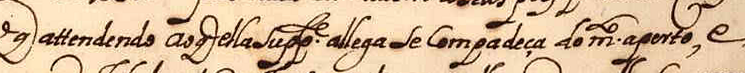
q̄ attendendo ao q̄ ella supp.te allega se Compadeça do m.to aperto, e
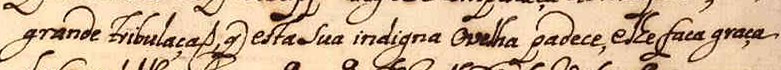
grande tribulaçaõ, q̄ esta sua indigna ovelha padece, e lhe faça graça
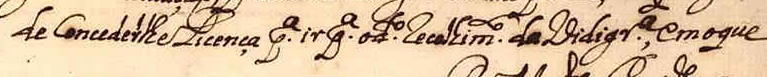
de Concederlhe Licença p.a ir p.a o d̄.o Recolhim.to da Vidigr.a, em o que
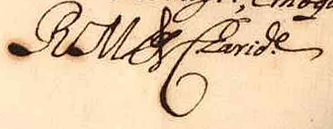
R M & Charid.e
